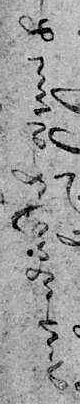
certidaõ de como he
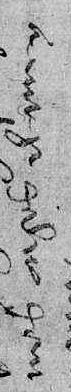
nos casos de mey
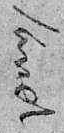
pay /
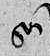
sor̄
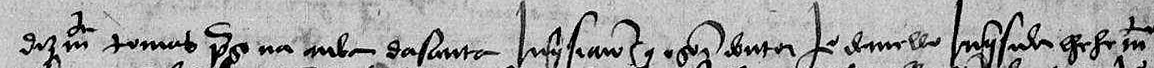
diz mte tomas p̄so na cadea da santa Jnqisiçaõ q̄ o sor̄ doutor Jo de mello Jnq̄sidor lhe he mto
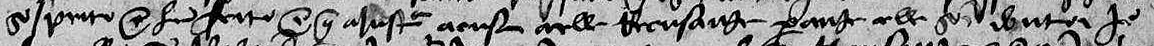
sospeito ē hū feito ē q̄ a Justa acusa a elle Recusante ꝑante elle sor̄ doutor Jo
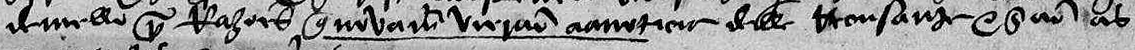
de mello p̄o Razões q̄ novamte vieraõ aa noticia delle Recusante e saõ as
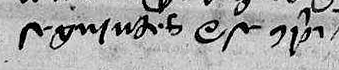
segujntes e se ꝯpir /
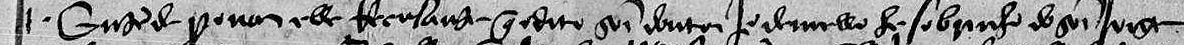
1. Entēde ꝓouar elle Recusante q̄ o dito sor̄ doutor Jo de mello he sobrinho do sor̄ Jorge
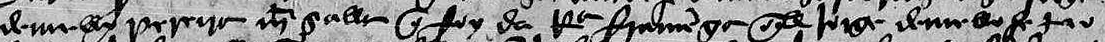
de mello pereira mte salla q̄ foy da Ra framēga o q̄ll Jorge de mello he tio
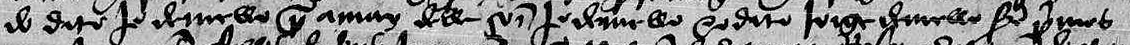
do dito Jo de mello p̄o a may delle sor̄ Jo de mello e o dito Jorge de mello ꞩē pimos
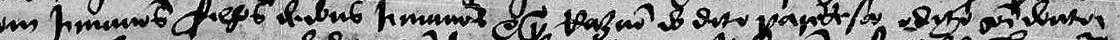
com Jrmaaõs filhos de dous Jrmaaõs e p̄o Razaõ do dito par̄etesco o dito sor̄ doutor
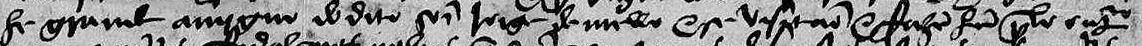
he grande amjguo do dito sor̄ Jorge de mello e se visitaõ e fazē hū p̄lo outro
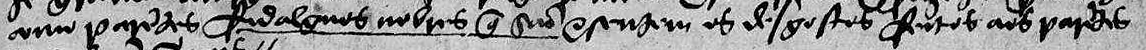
como parētes fidalguos nobres q̄ saõ e sentem os desgostos feitos aos parētes
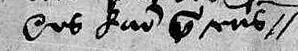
e os haõ p̄o seus //
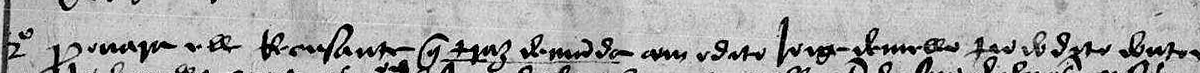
2o Ꝓouara elle Recusante q̄ traz demāda com o dito Jorge de mello tio do dito doutor
